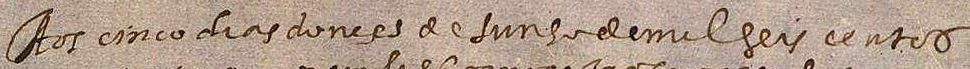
Aos cinco dias do mes de Junho de mil seiscentos
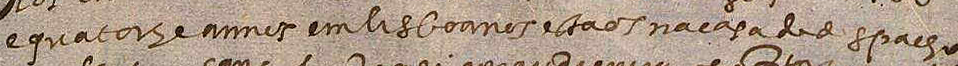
e quatorze annos em lisboa nos estaos na casa do despacho
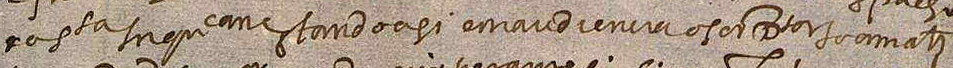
da sta Inqu.çan estando ahi em audiencia o sor̄ Dtor Joam al̄z
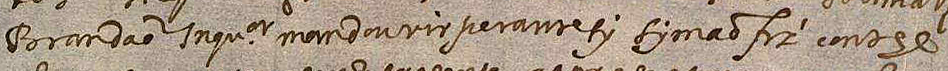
Brandaõ Inqu.or mandou vir perante sy symaõ frz̄ conthe
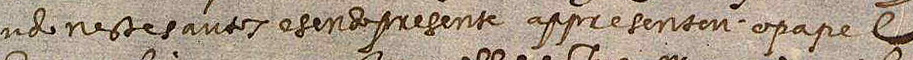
udo nestes autos e sendo presente appresentou o papel
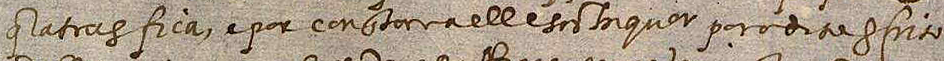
q̄ atras fica, e por constar a elle sor̄ Inquor por o dito esCrito
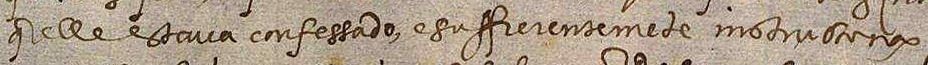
q̄ elle estaua confessado, e sufficientemēte instructo nas
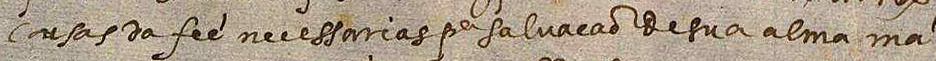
cousas da feé necessarias pa saluaçaõ de sua alma mā
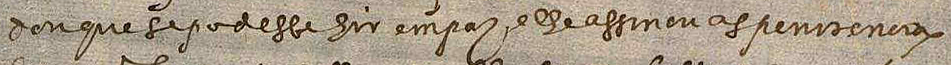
dou que se podesse hir em paz, e lhe assinou as penitencias
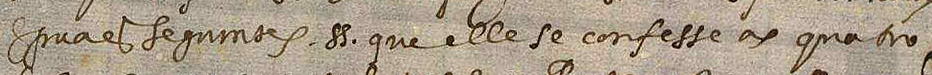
spuaes seguintes .ss. que elle se confesse as quatro
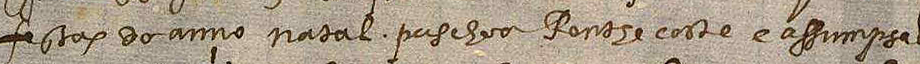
festas do anno natal. paschoa Penthecoste e assumpsaõ
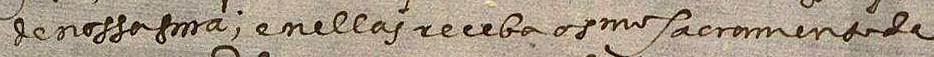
de nossa snrā; e nellas receba o smo Sacramento da
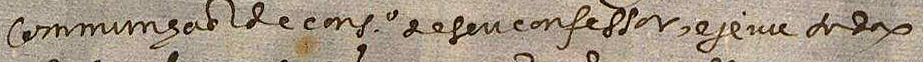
communhaõ de cons.o de seu confessor, e jeiue todas
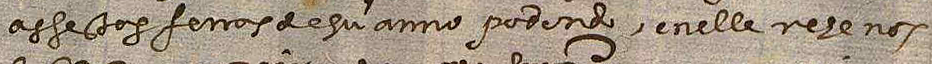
as sestas feiras de hū anno podendo, e nelle reze nos
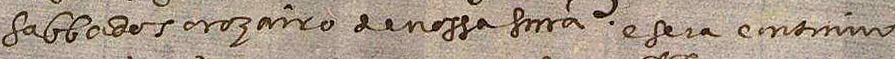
sabbados o rozairo de nossa snrā. e seia continuo
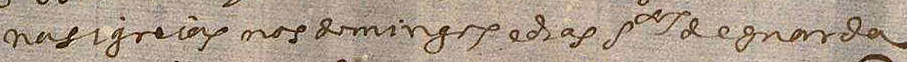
nas igreias nos domingos e dias stos de guarda
